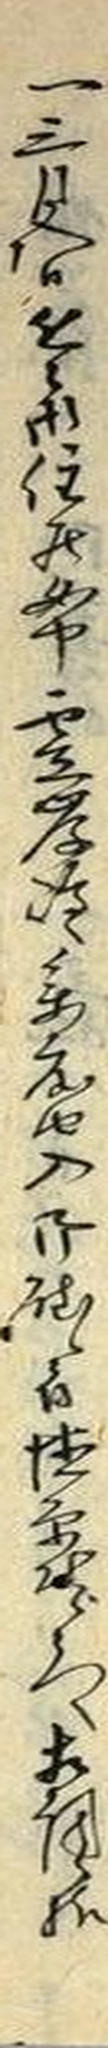一三月八日近々御住居女中霊岸嶋へ参度由入御聴候ニ付植原次郎右衛門へ相伺候様
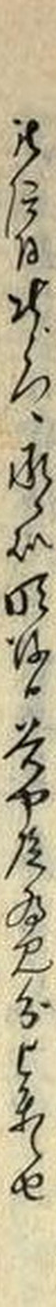被仰付次郎右衛門へ承候処明後日谷中殿為見分被参候由
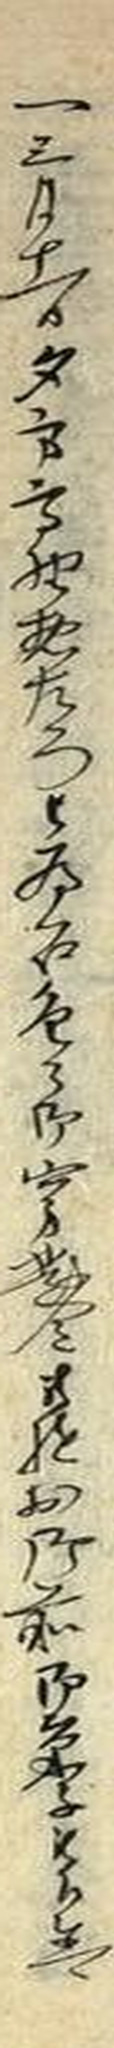一三月十一日夕方高野惣左衛門被為召色々御穿鑿被遊於御前御菓子被下置候
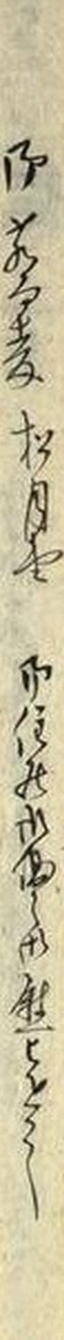御蕎麦松月堂御住居御側之御慰被進之
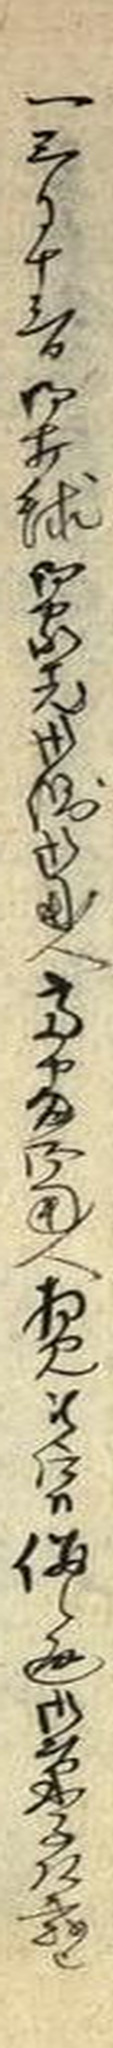一三月十三日御打毬御家老御側御用人当番御用人拝見被仰付例之通御菓子頂戴被
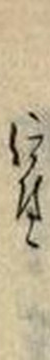仰付候
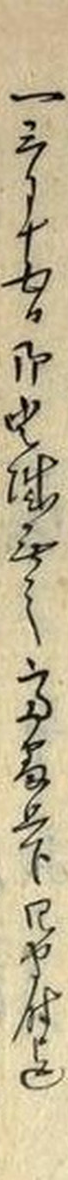一三月十五日御登城無之当番上下四半時迄
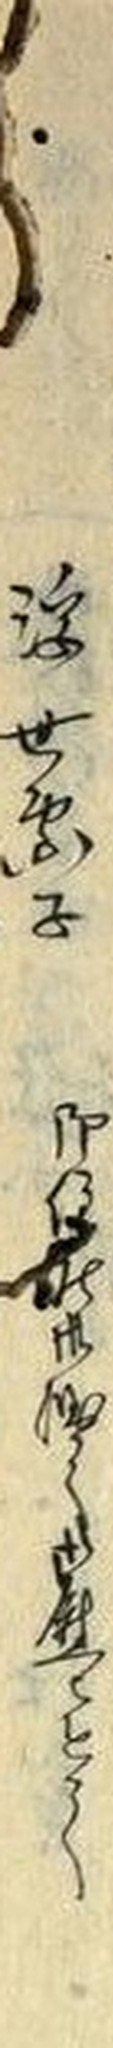浮世団子御住居御側之御慰被進之

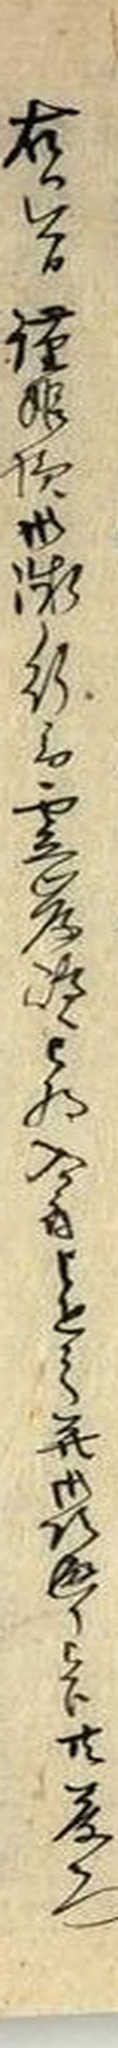右ハ今日謹姫様御微行ニ而霊岸嶋へ被為入候ニ付被進之并御次通り被下共藤右衛門
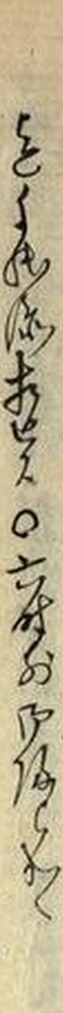迄手紙添相廻ス○六時前御帰被成候
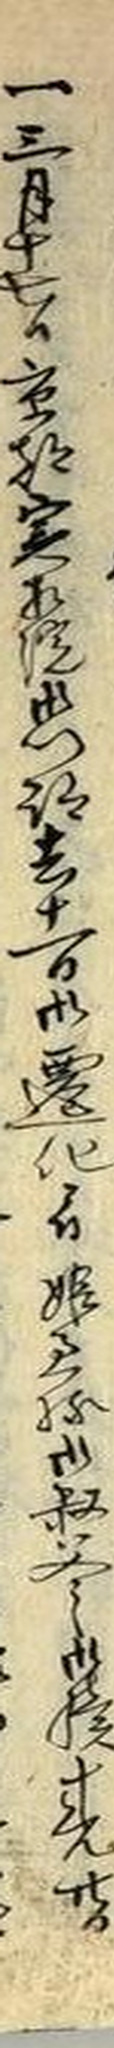一三月十七日京都実相院御門跡去十一日御遷化ニ付姫君様御叔父之御続来ル廿日
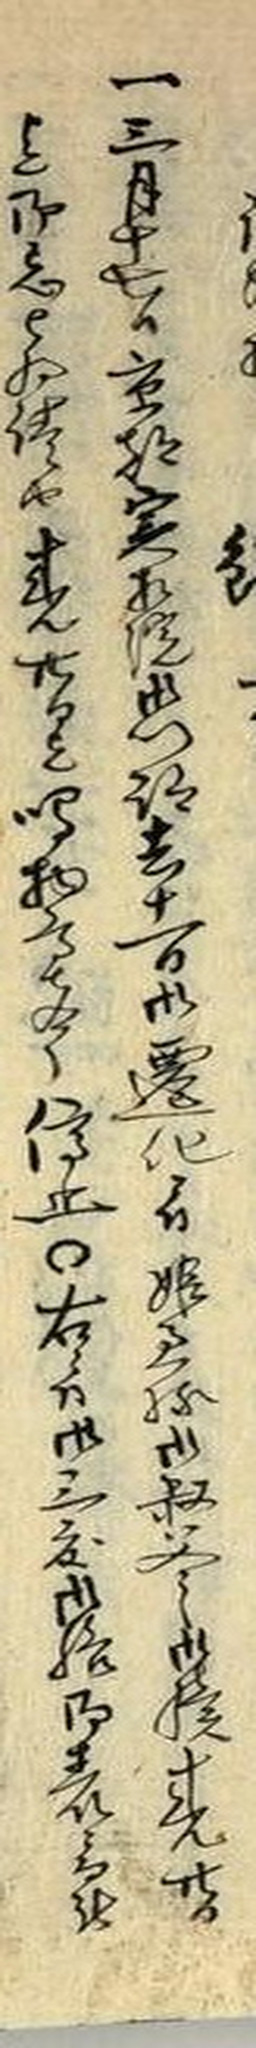迄御忌被為請候由来ル廿日迄鳴物高声之停止○右ニ付御三度御膳御表ニ而被
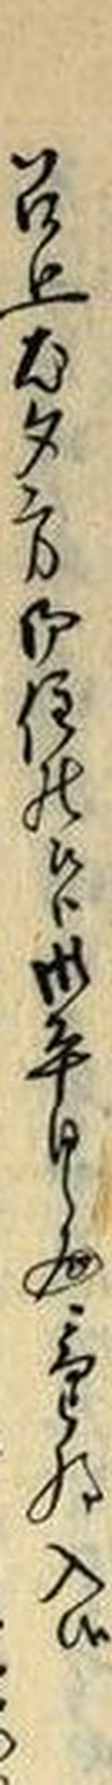召上尤夕方御住居江ハ御平日之通ニ而被為入候
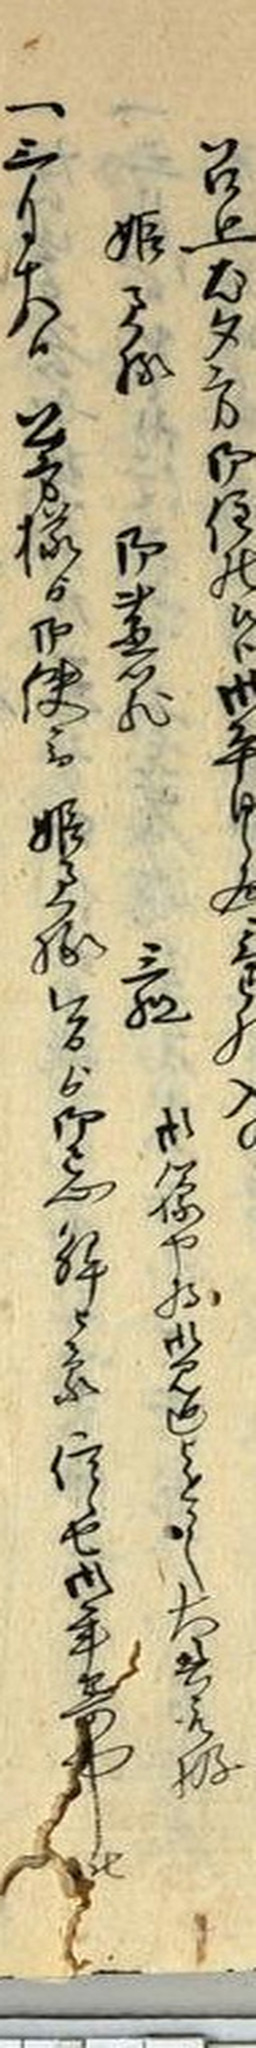三月十八日公方様ゟ御使ニ而姫君様今日ゟ御忌解被蒙仰候由御年寄中被
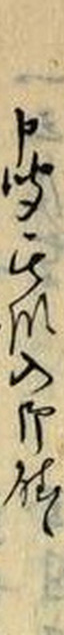申聞其段入御聴候
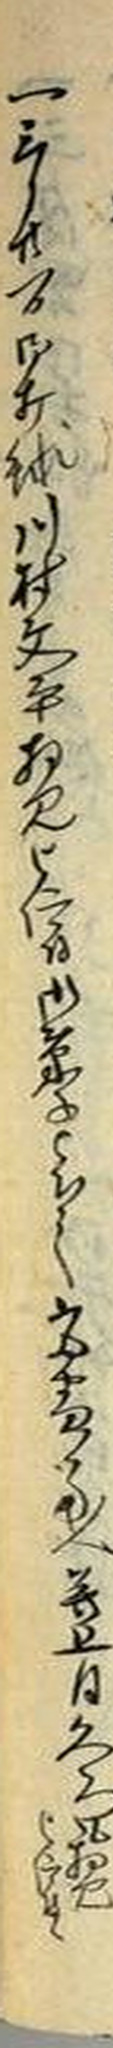一三月廿一日御打毬川村文平拝見被仰付御菓子被下之当番御用人并上月久右衛門も拝見被仰付候
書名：少傅日録抄（斉承付側向頭取日記、在府）
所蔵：福井県文書館 Fukui Prefectural Archives
